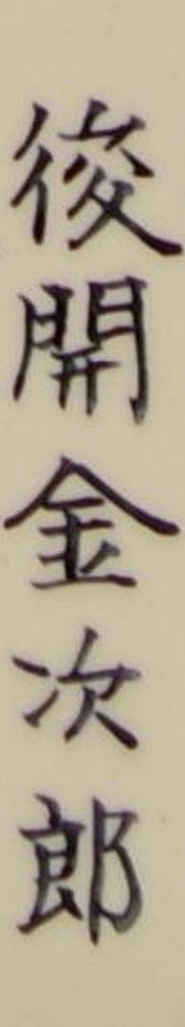俊開金次郎
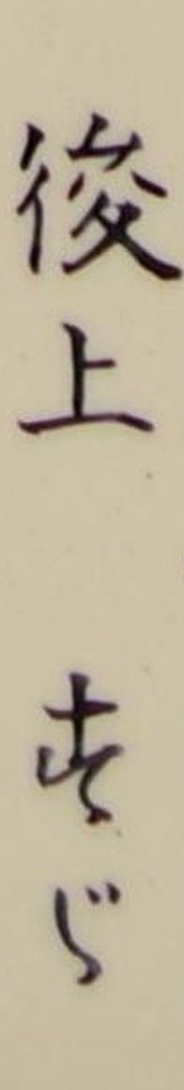俊上すゞ
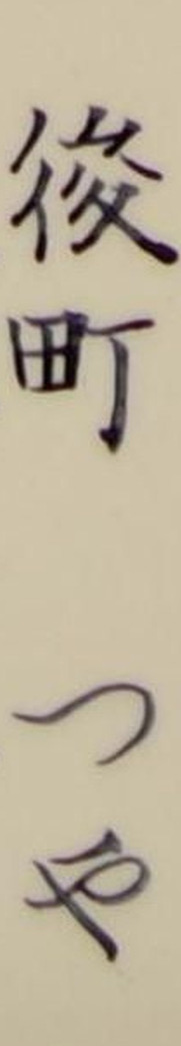俊町つや
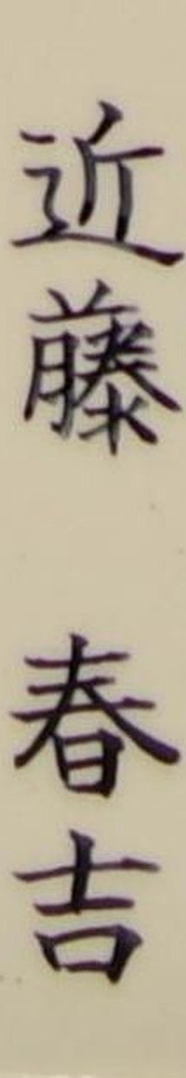近藤春吉
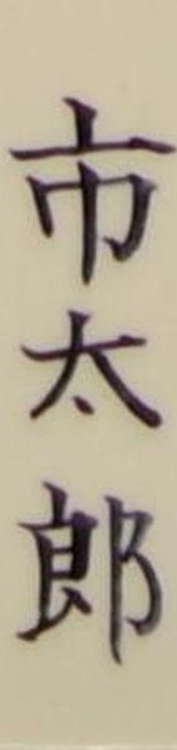市太郎
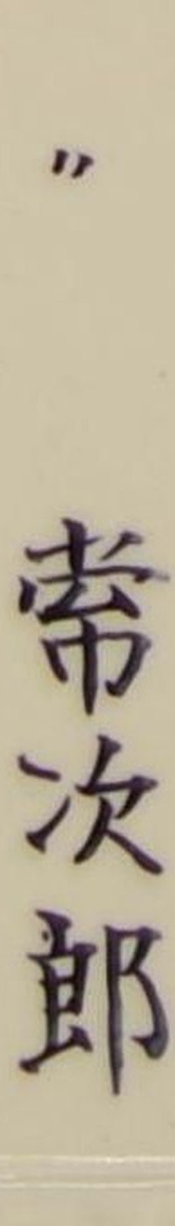常次郎
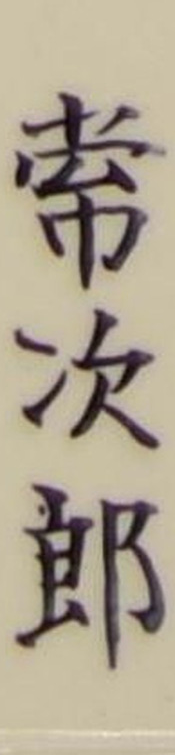常次郎
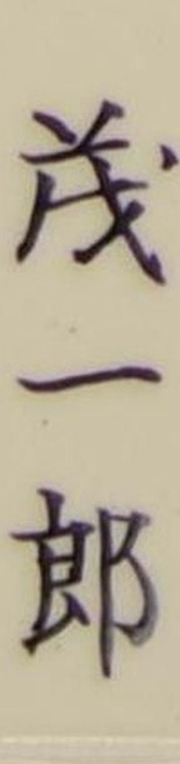茂一郎

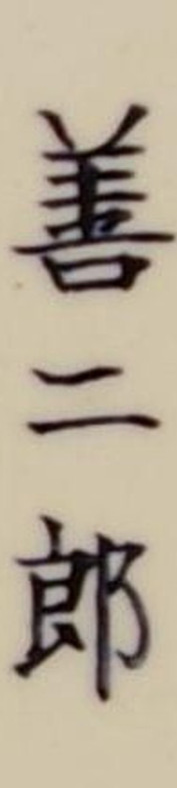善二郎
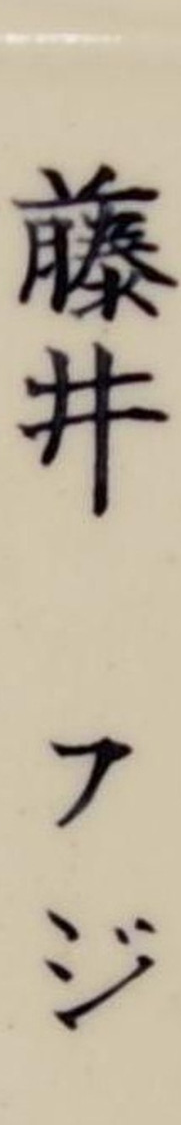藤井フジ
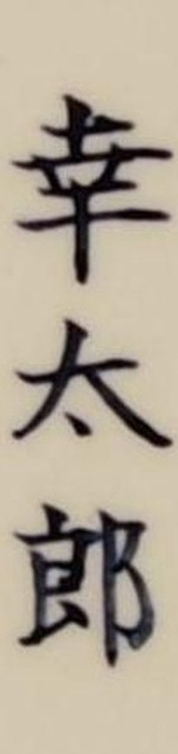幸太郎
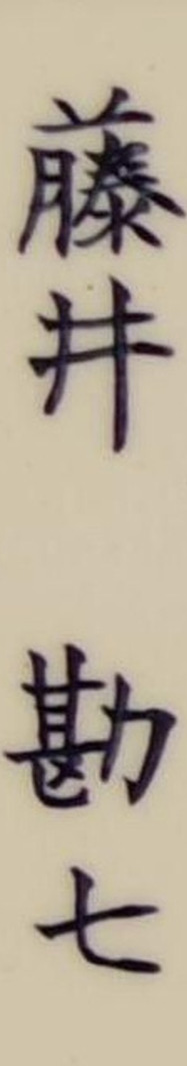藤井勘七
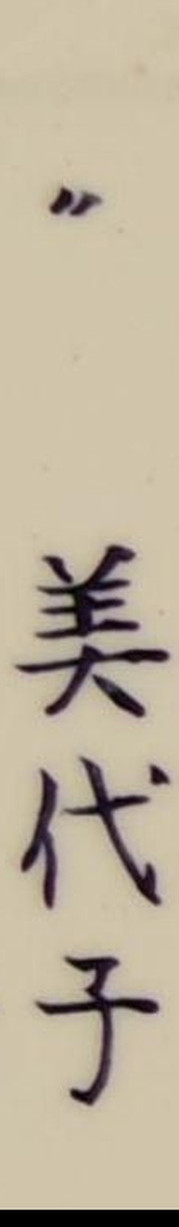美代子
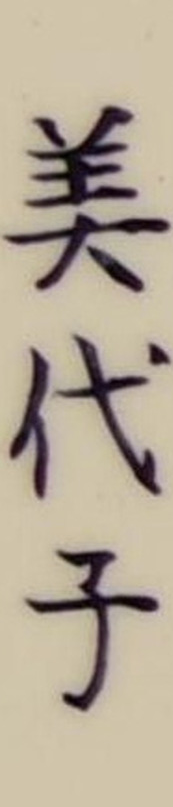美代子
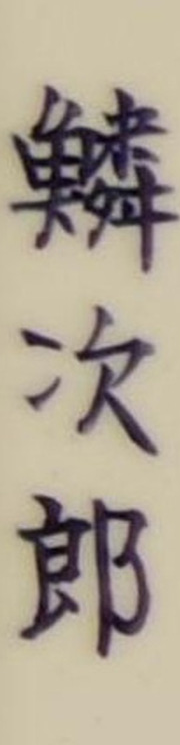鱗次郎

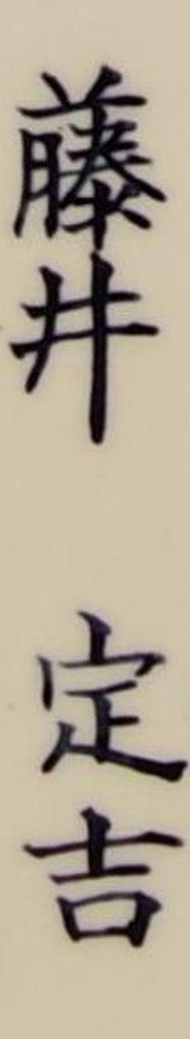藤井定吉
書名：E~L
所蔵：高野山金剛峯寺
